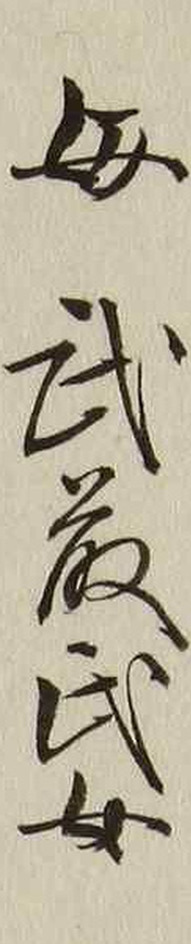母武藤氏女
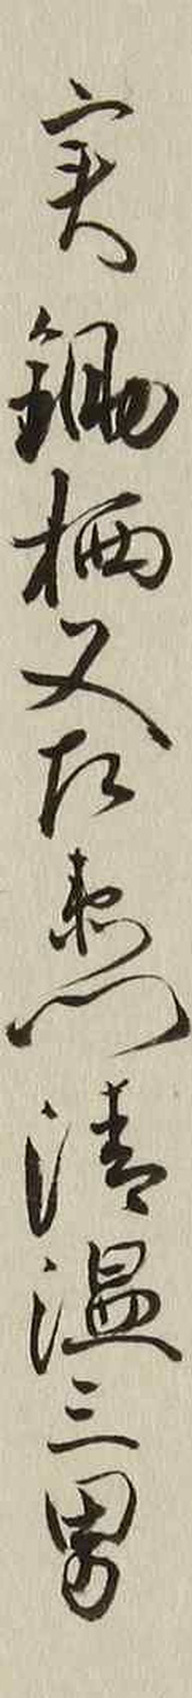実鋤栖又左衛門清温三男
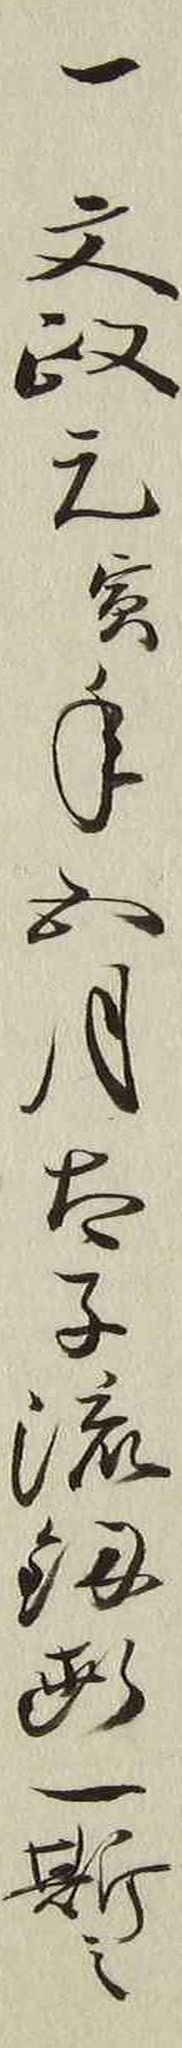一文政元寅年五月太子流剣術一斯之
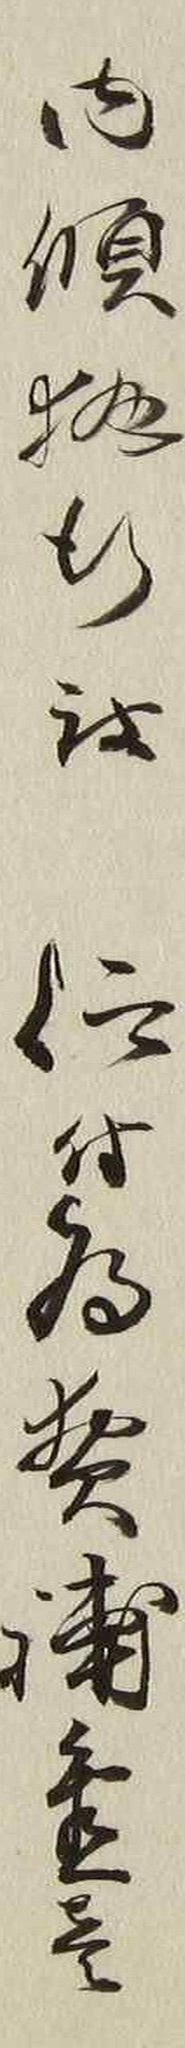内傾執行被仰付為費補金壱
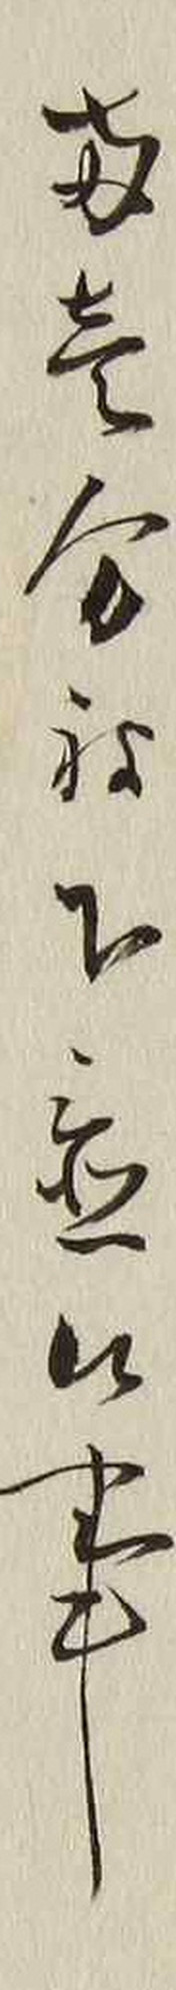両壱分被下置候事
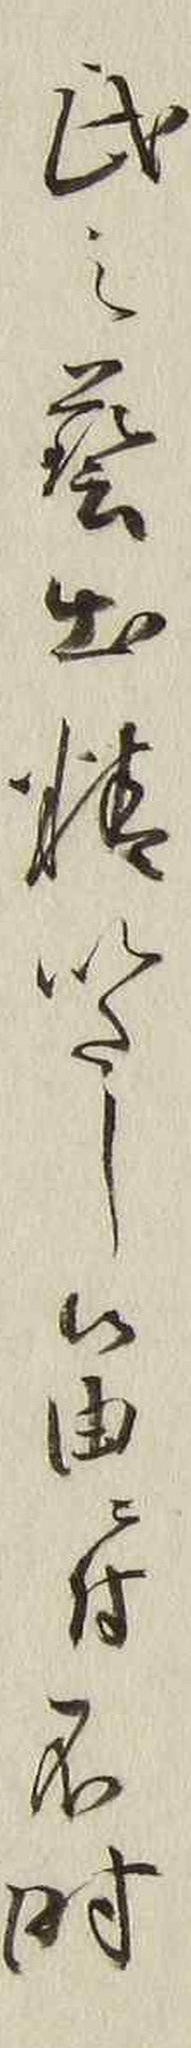武之芸出精いたし候由ニ付不時
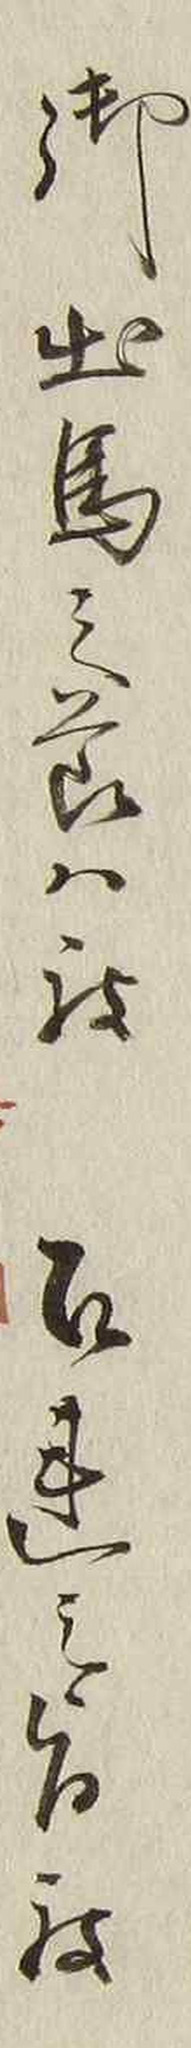御出馬之節は被召連之旨被

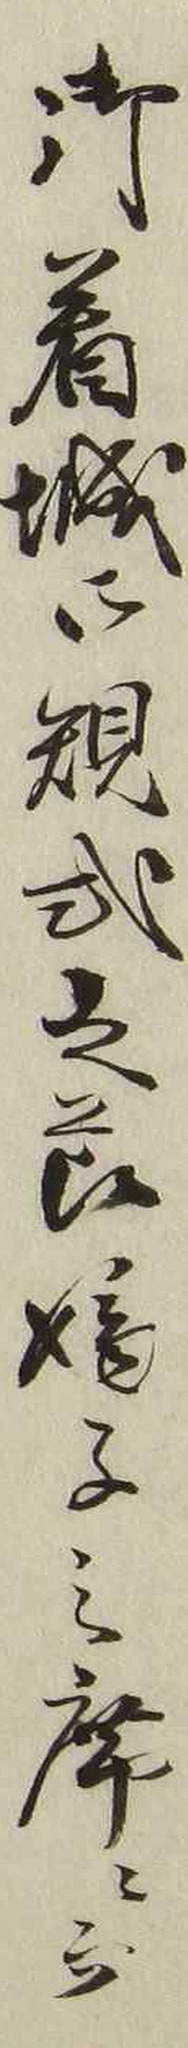御着城御観式之節嫡子之席ニ而
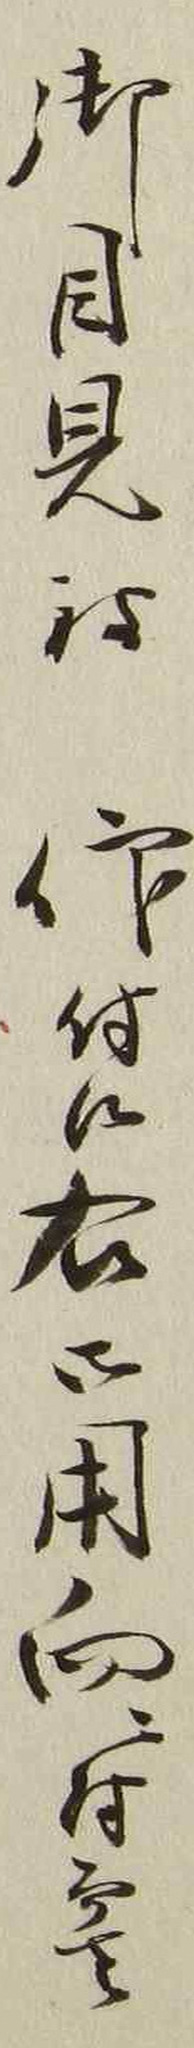御目見被仰付候右御用向ニ付而は
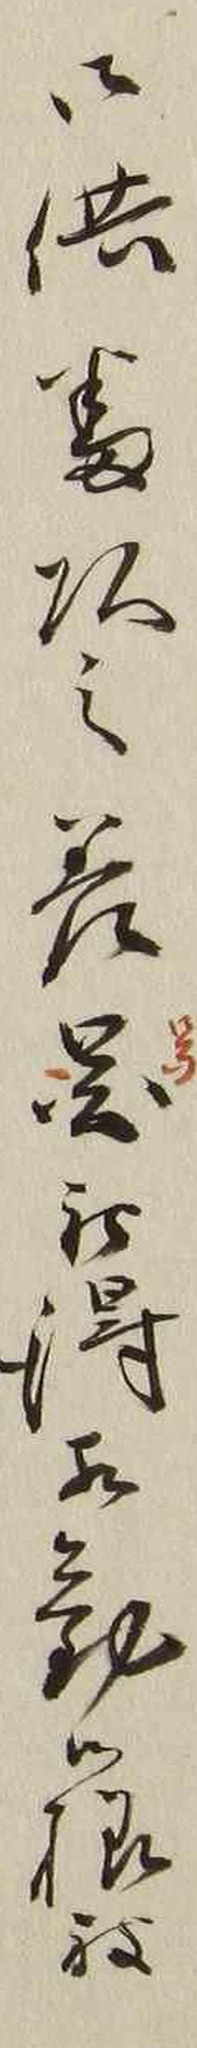御供番頭之差図被得相勤候様被
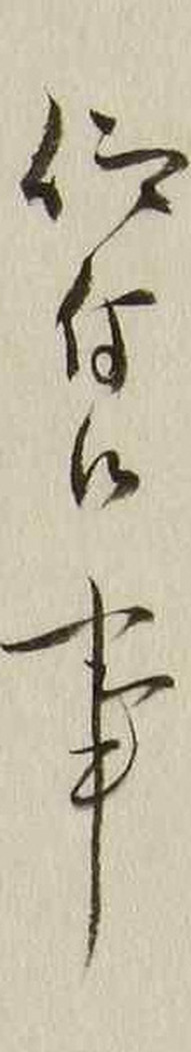仰付候事
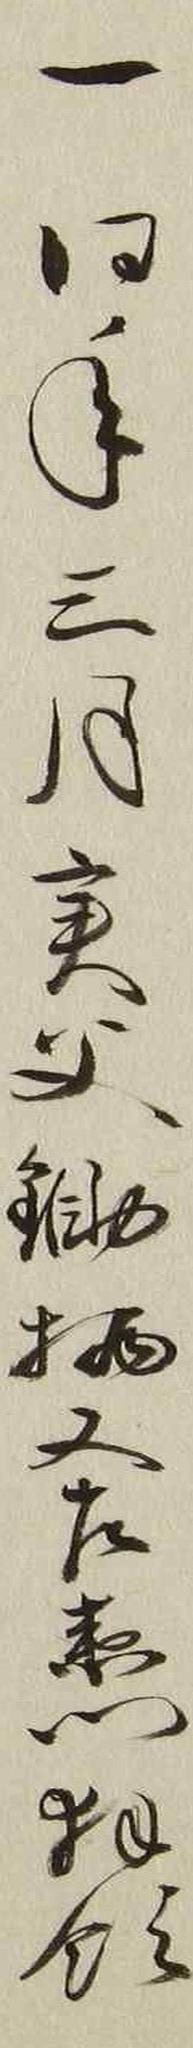一同年三月実父鋤栖又左衛門拝領
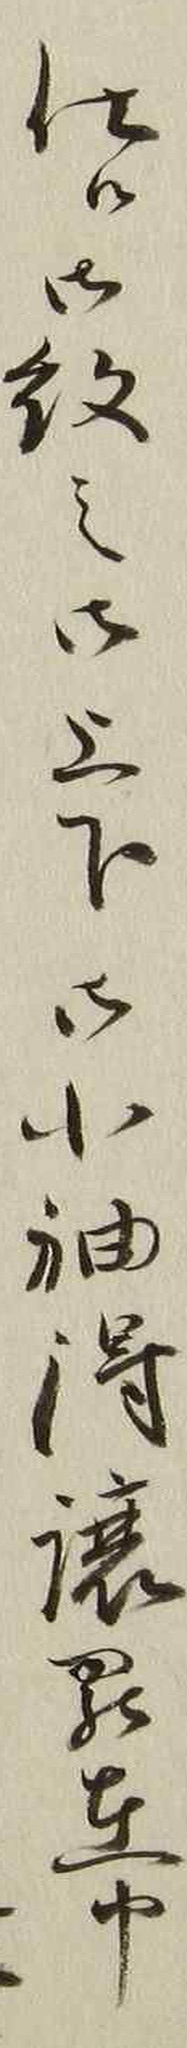仕候御紋之御上下御小袖得譲罷在申
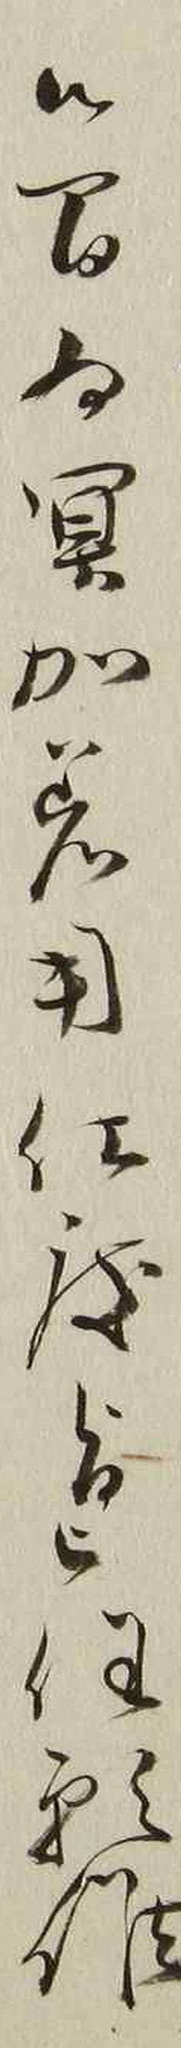候間為冥加着用仕度旨被任願候
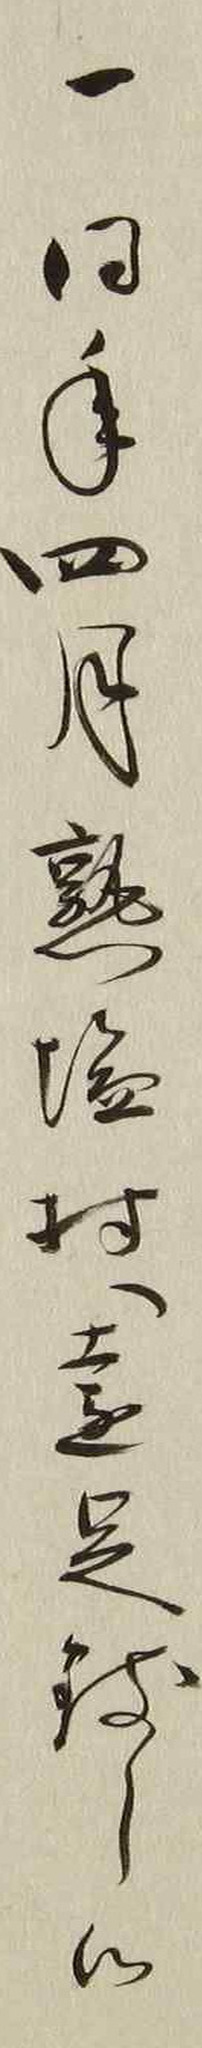一同年四月熟塩村ㇸ遠足致し候
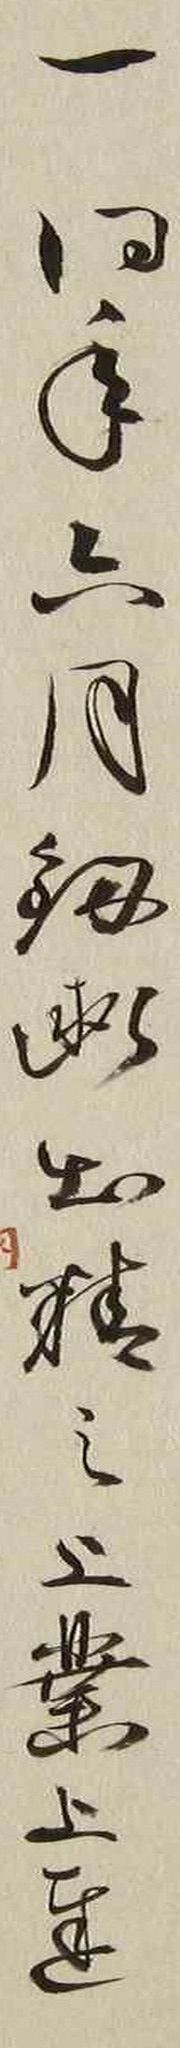一同年六月剣術出精之上業上達
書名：諸士系譜　巻之163　な之部5
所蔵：会津若松市立会津図書館
